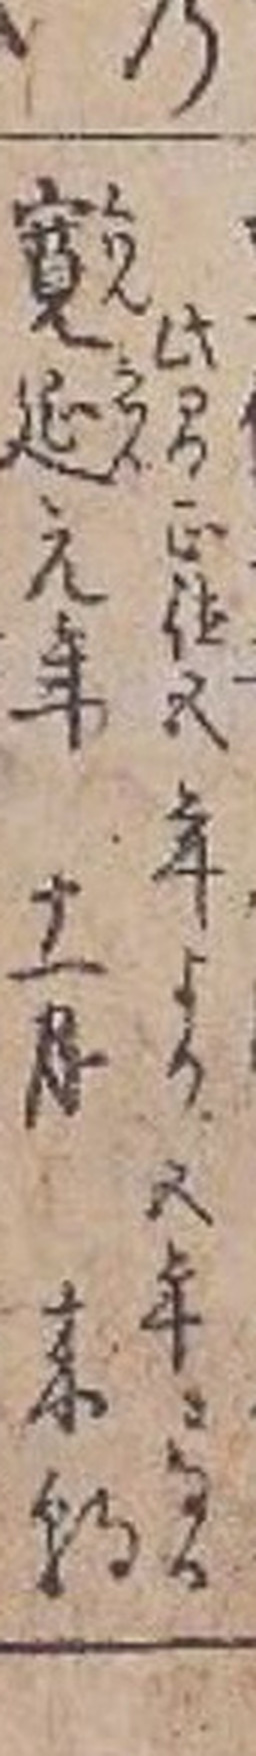寛延元年十一月来朝
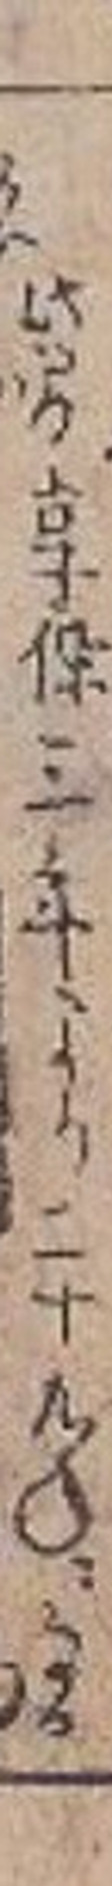此間享保三年より二十九年になる
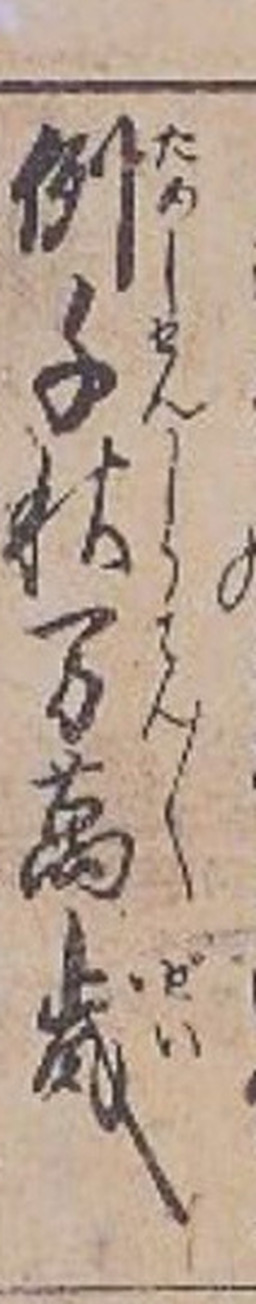例千秋万萬歳
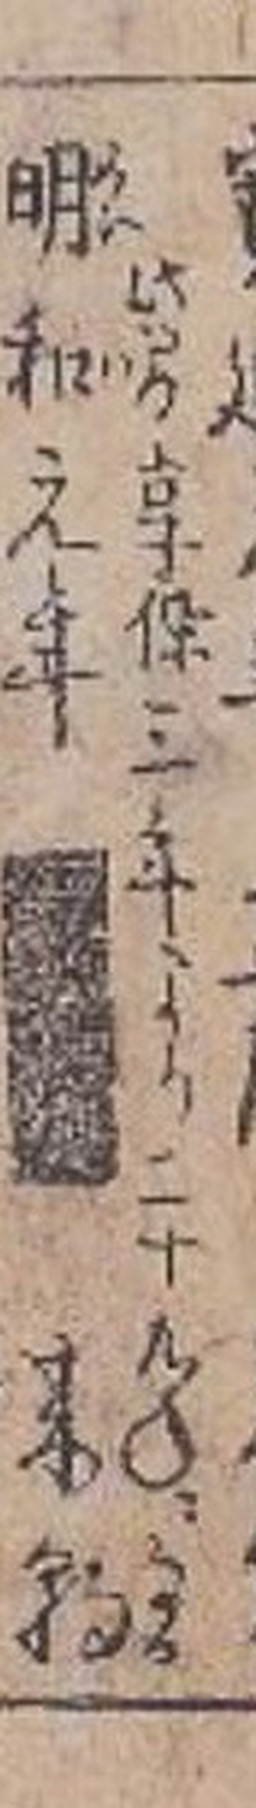明和元年来朝
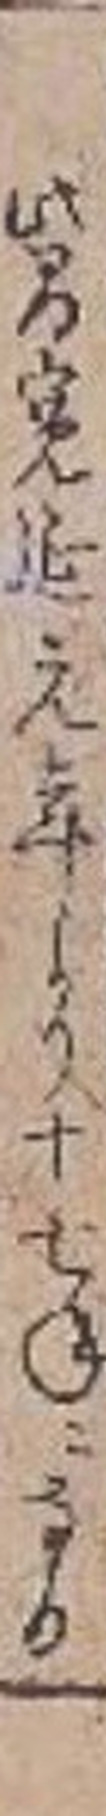此間寛延元年より十七年になる

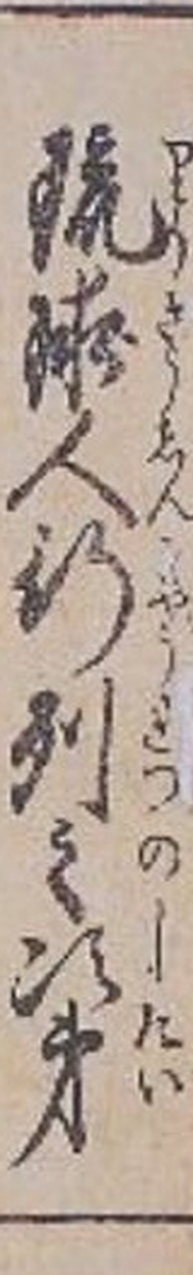琉球人行列之次第
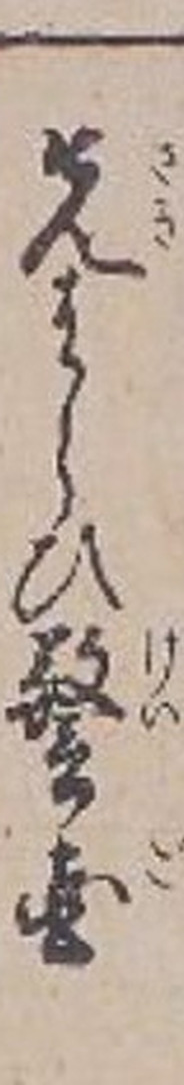先はらひ警固
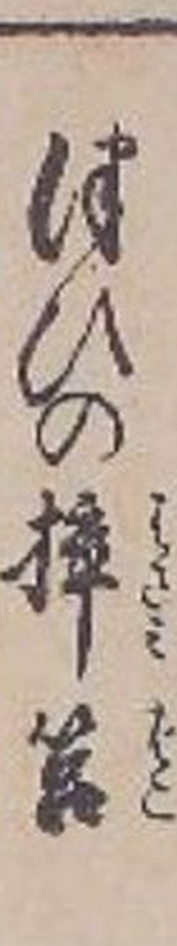つひの挟箱
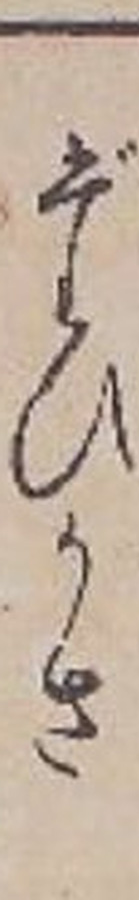だひかさ
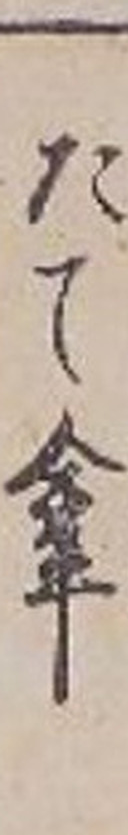たて傘
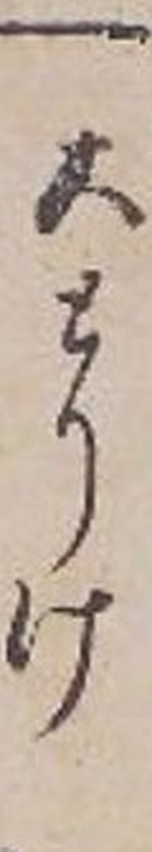大とりけ
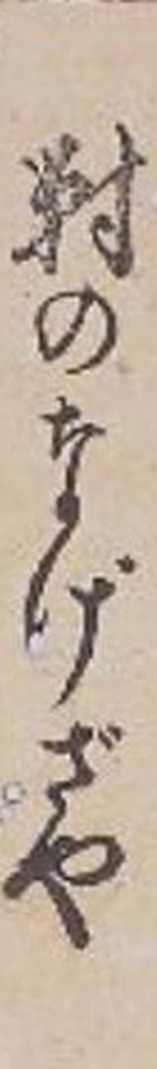對のなげざや
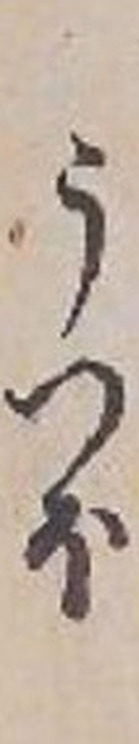うつほ

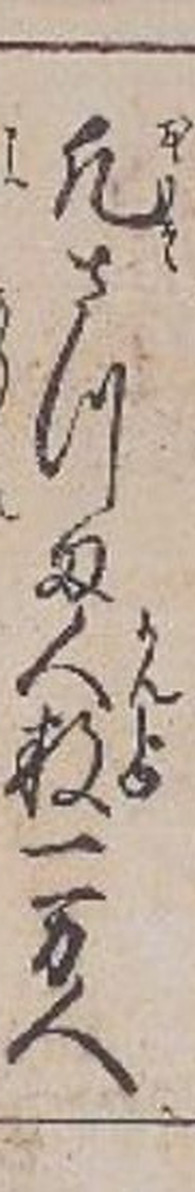凡さつま人数一万人
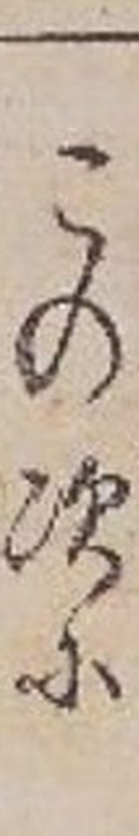この次に
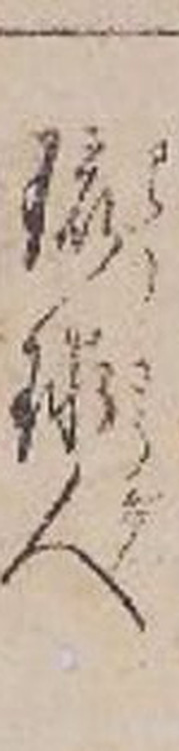琉球人
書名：琉球人大行列記 来朝新板絵入
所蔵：University of the Ryukyus Library
